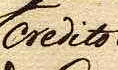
credito
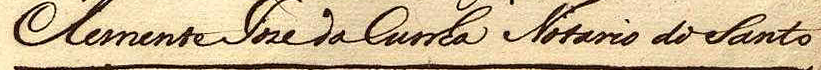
Clemente Ioze da Cunha Notario do Santo
